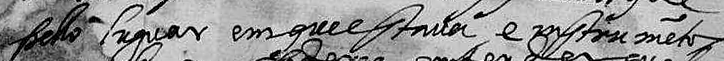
pello luguar em que estaua, e instrumētos
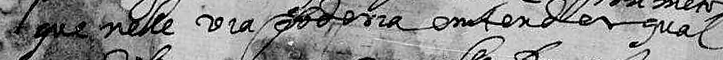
que nelle via poderia emtender qual
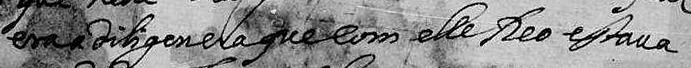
era a diligencia que com elle Reo estaua
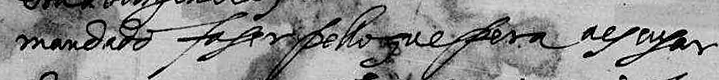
mandado faser pello que pera a escusar
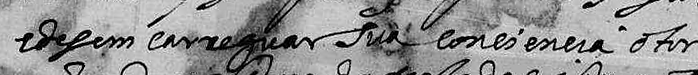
E desemcarreguar sua conciencia o tor
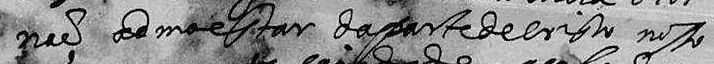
naõ admoestar da parte de cristo nosso
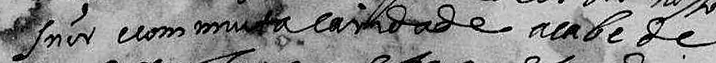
snōr com muita caridade acabe de
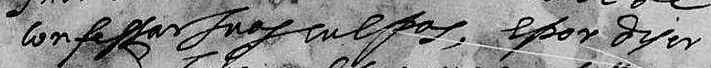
confessar suas culpas, e por diser
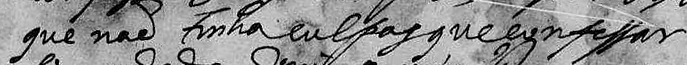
que naõ tinha culpas que confessar
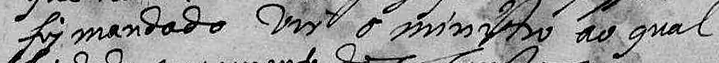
foj mandado vir o ministro ao qual
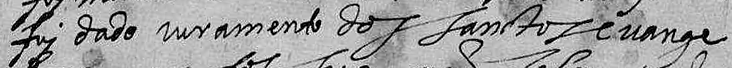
foj dado iuramento dos sanctos euange
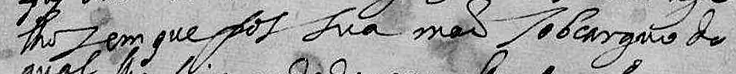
lhos em que pos sua maõ sob carguo do
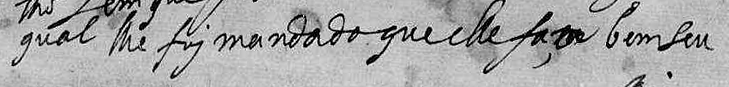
qual lhe foj mandado que elle faça bem seu
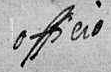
officio
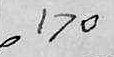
170
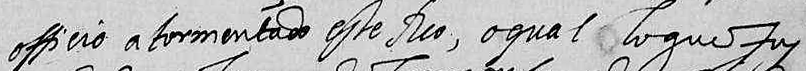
officio atormentado este Reo, o qual loguo foy
